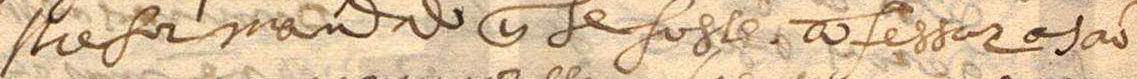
lhe foi mandado q̄ se fosse c̄ofessar a saõ
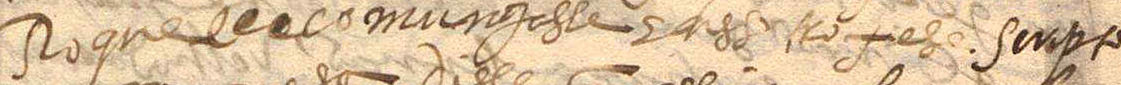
Roque e co comungasse E disso troxese. scripto
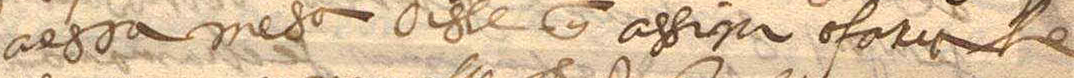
a esta mesa disse q̄ assim o faria he
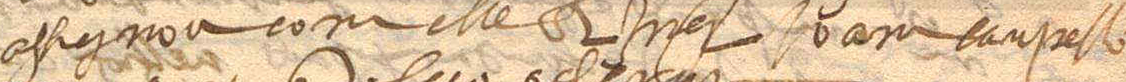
assignou com elle Sor Jnq̄r Joam canpello
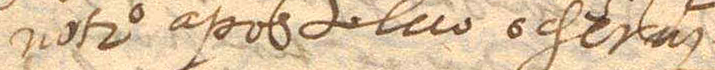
notro apostolico o escruj
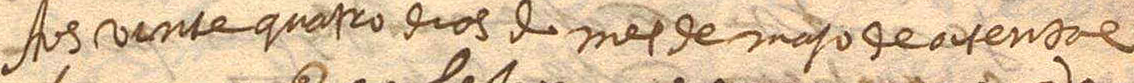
Aos vinte quatro dias do mes de majo de oitenta e
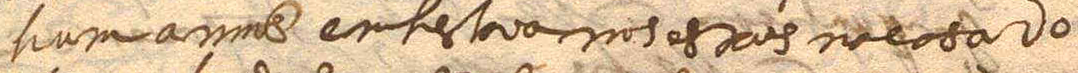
hum annos em lisboa nos estaos na casa do
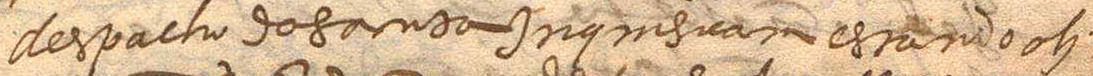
despacho da santa Jnquisicam estando alj
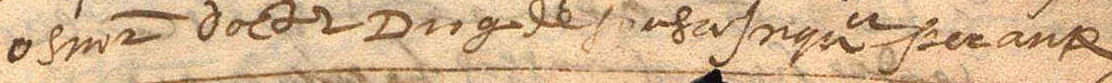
o snor̄ doctor Diogo de sousa Jnquor perante
